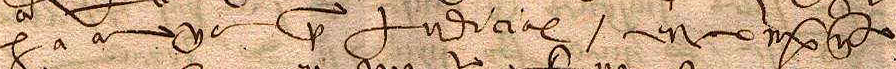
ha avya p̄o Judiçial / em comp̄mto
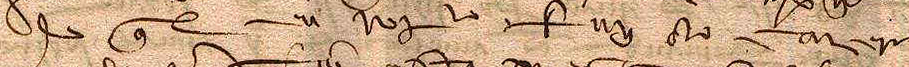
do q̄l eu notro fuy Ao carçere
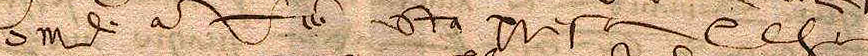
omde a Ree esta presa e lhe
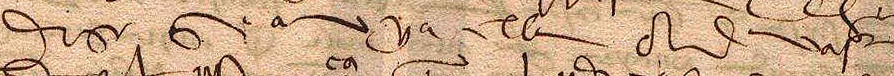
dise se avya ella A devasa
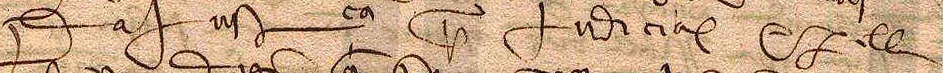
da Justça p̄o Judicial e ꝑ ella
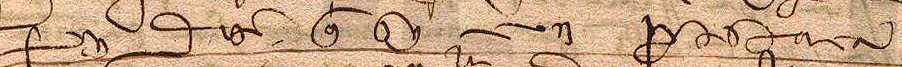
foy dito q̄ sy com ꝓtestacā
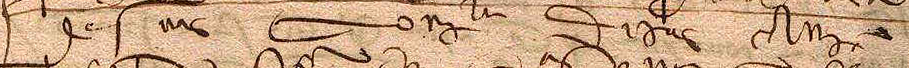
de suas Contraditas Anto
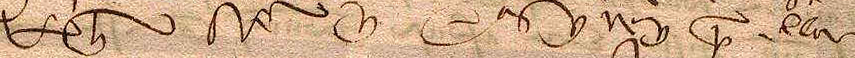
Roj̄z o sprvy e asyney p̄o ella
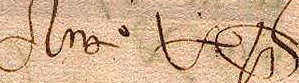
Anto Roj̄z
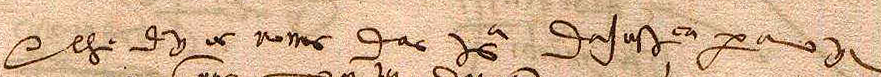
e lhe dey os nomes das tsa da Justça ꝑa vyr
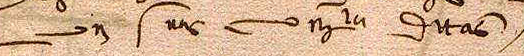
com suas contraditas /
